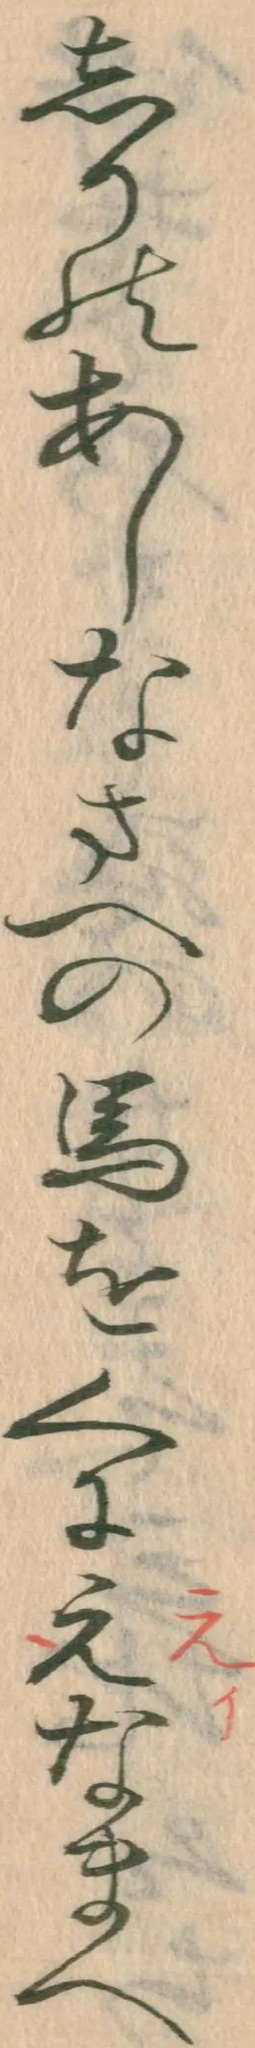しりのあしなまへの馬をくにえなまへ
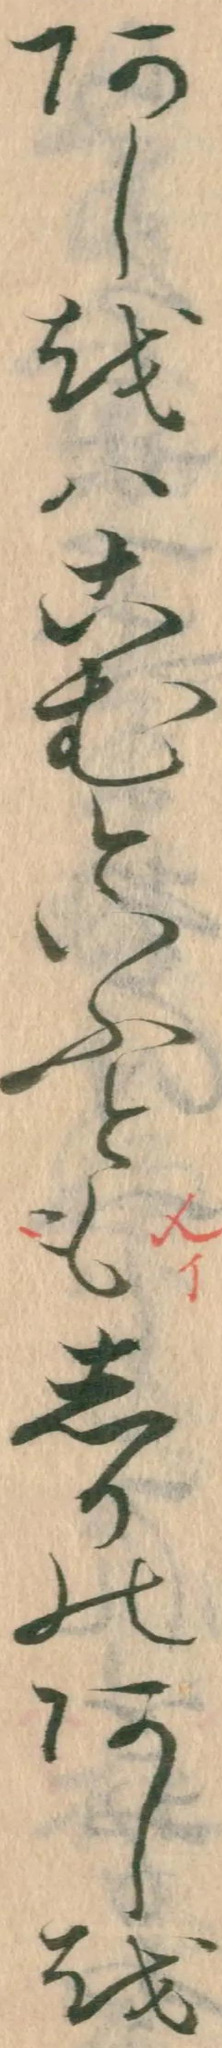あしをはこむといふともしりのあしお
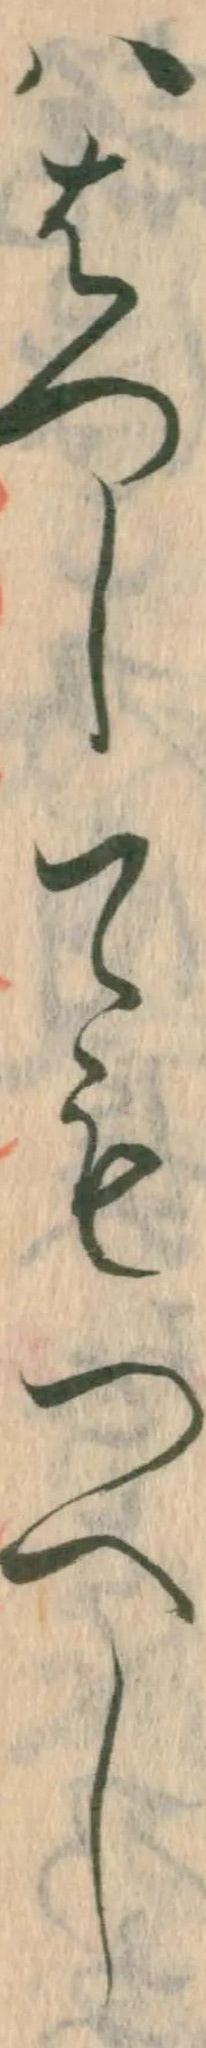ははつしてもつへし
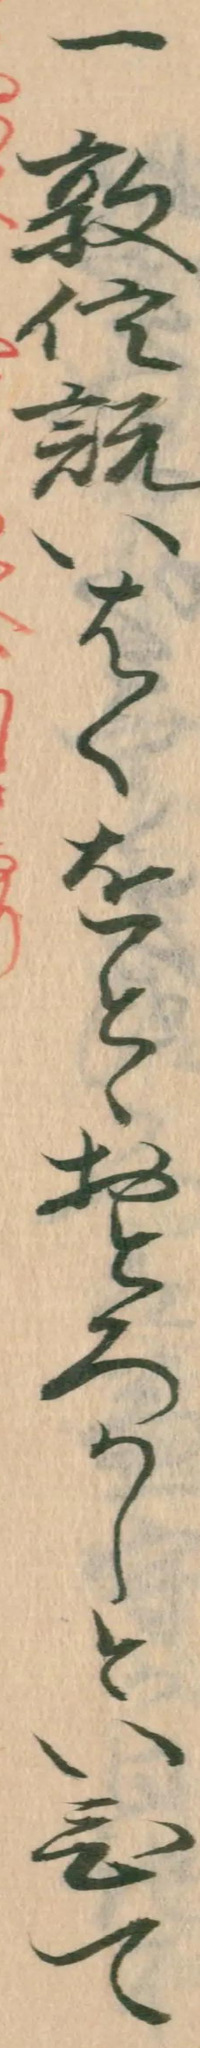一敦信説いはくをとゝおとろかしといひて
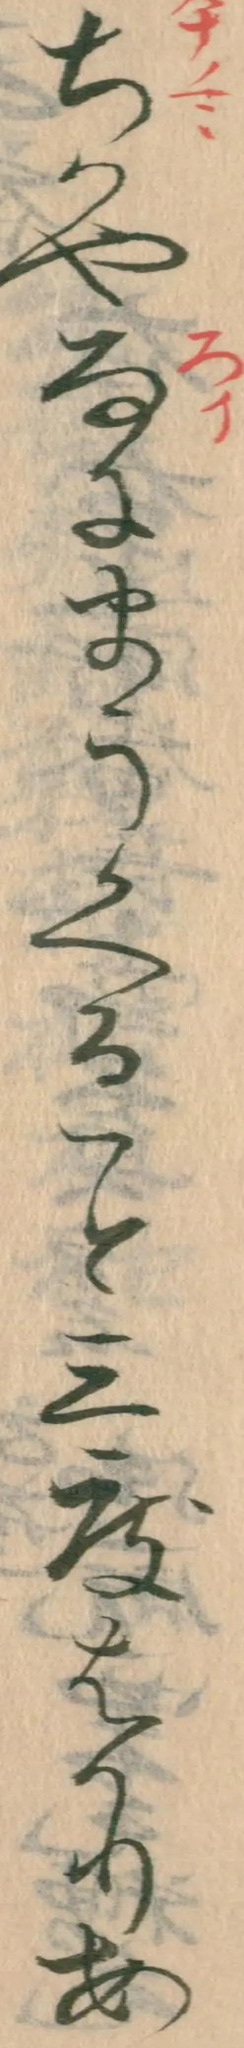ちかやるにまうくること三度はかりあ
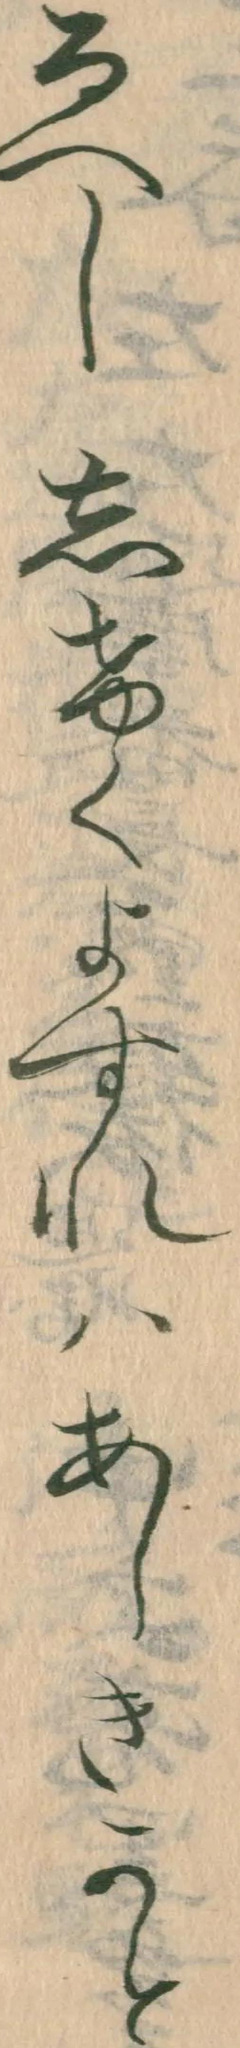るへししけくよすれはあしきかと
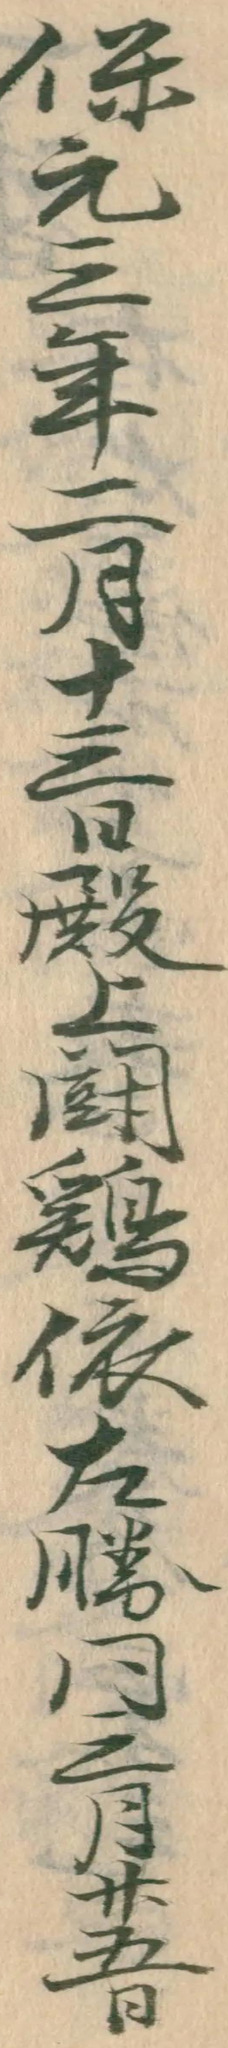保元三年二月十三日殿上闘鶏依左勝同三月廿五日
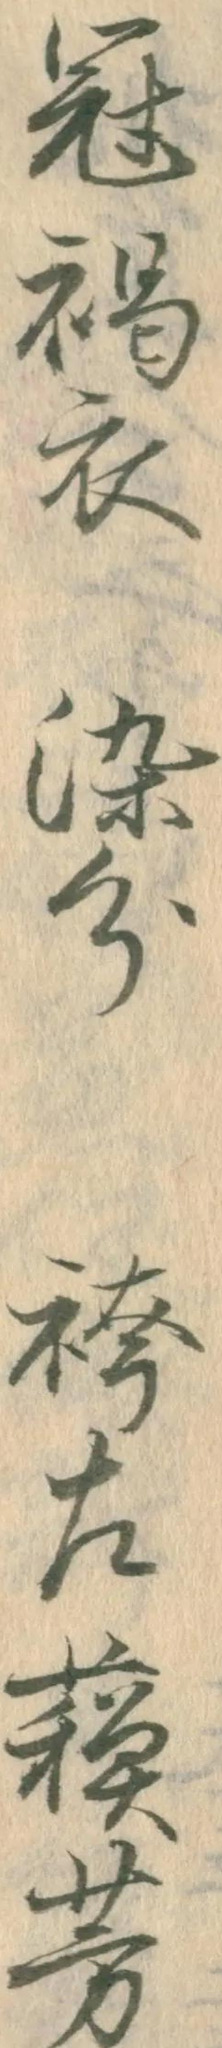冠褐衣染分袴左蘇芳
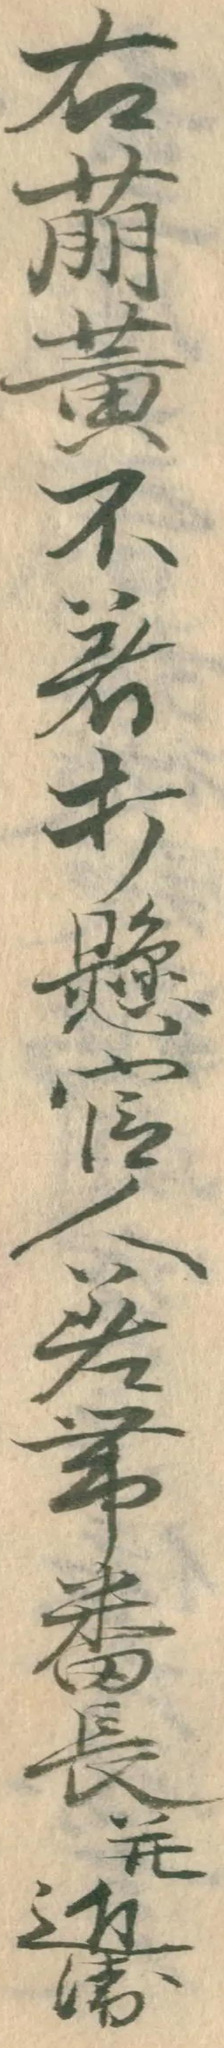右萌黄不着打懸官人差帯番長并近衛
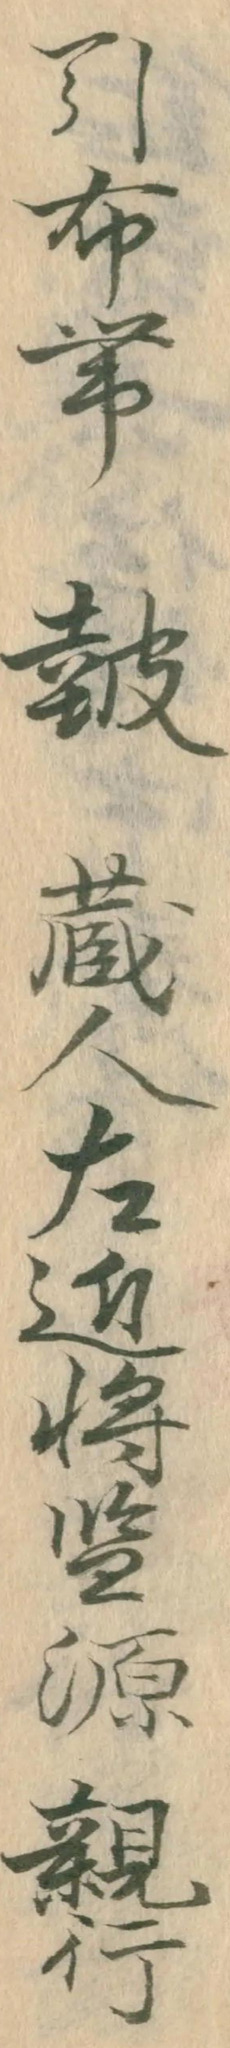引布帯鼓蔵人左近将監源親行

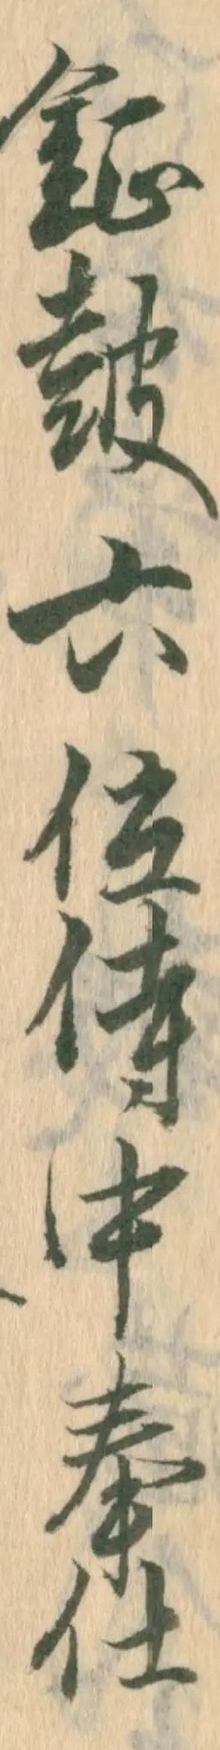鉦鼓六位侍中奉仕
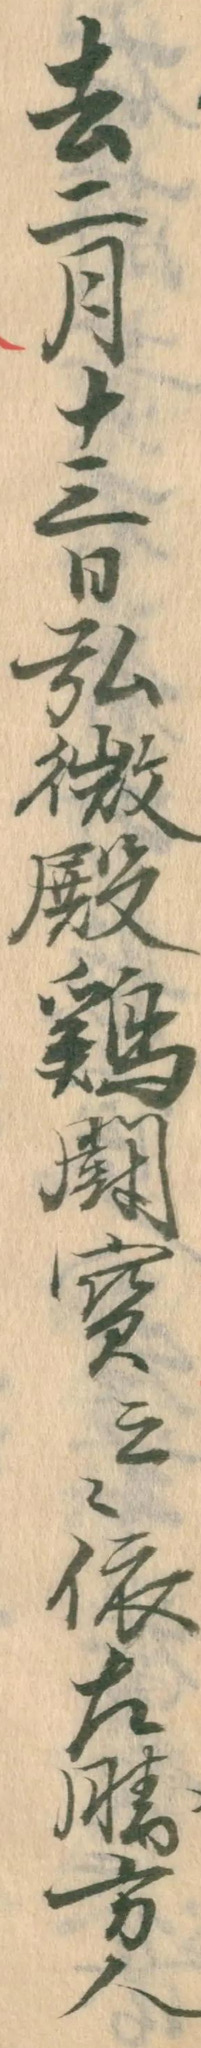去二月十三日弘微殿闘鶏宝云々依左勝方人
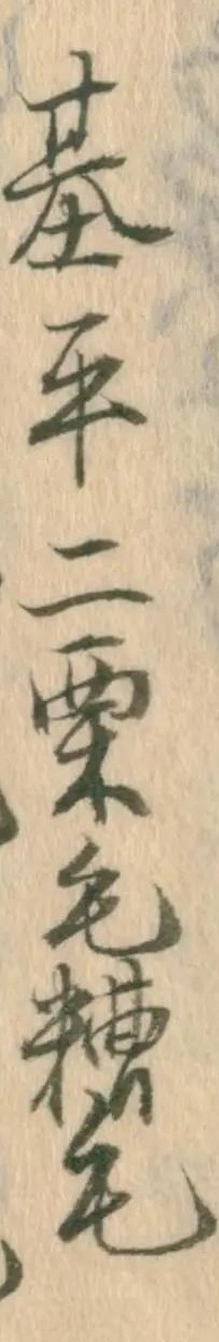基平二栗毛糟毛
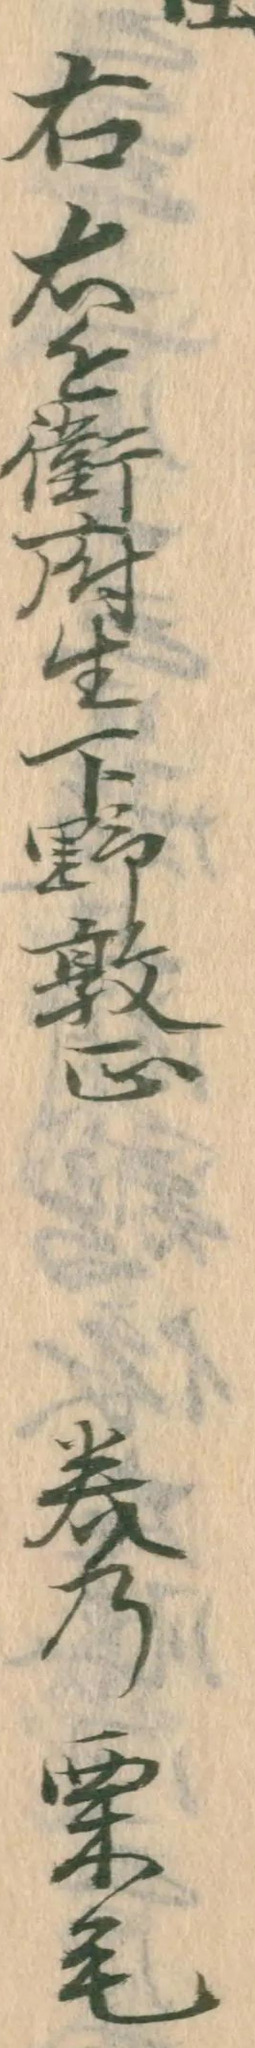右右近衛符生下野敦正巻の栗毛
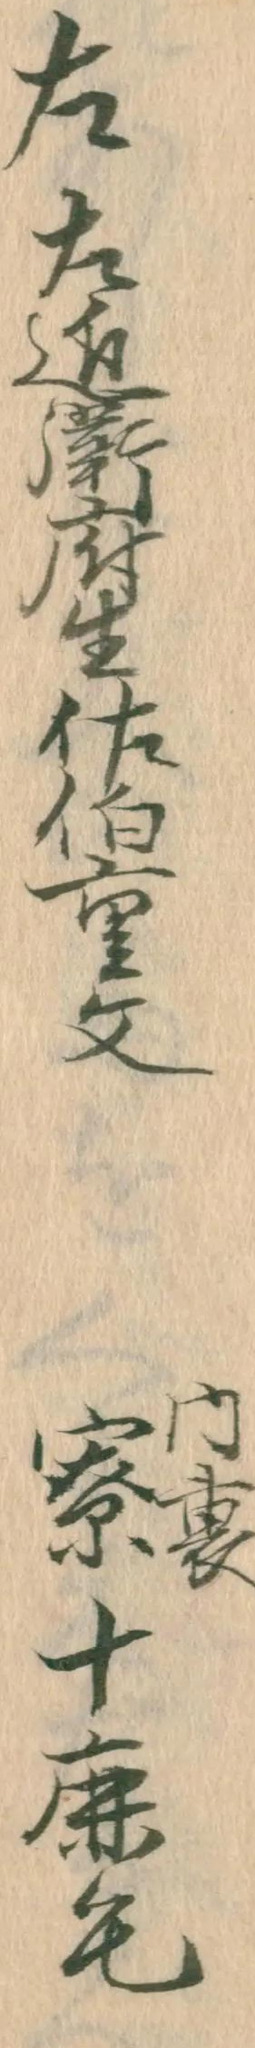左左近衛府生佐伯重文寮十鹿毛
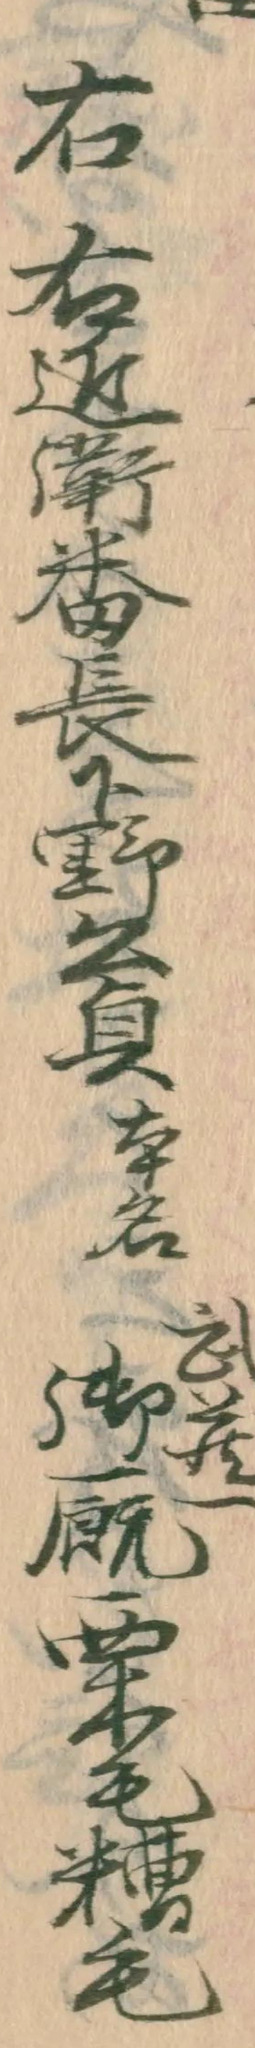右右近衛番長下野公貞本名御厩栗毛糟毛
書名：賀茂社記録. 第13冊
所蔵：国立国会図書館 National Diet Library, JAPAN
